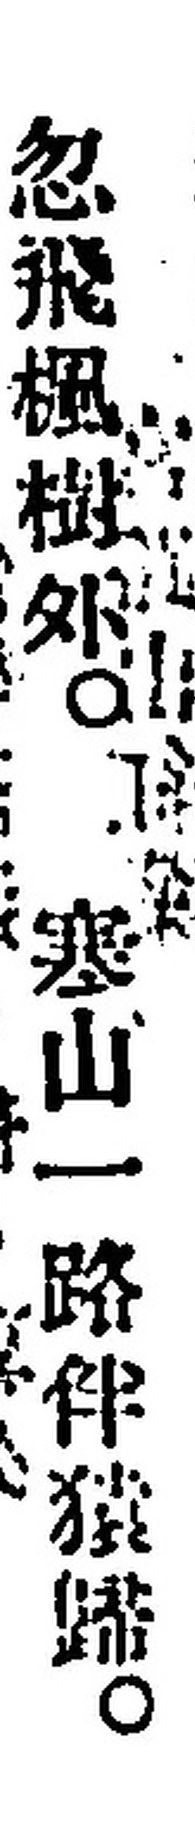忽飛楓樹外。寒山一路伴猿帰。
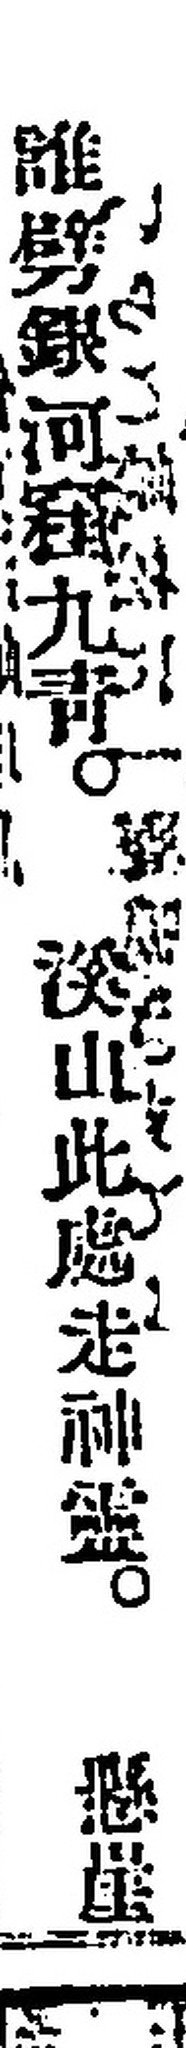誰劈銀河九青。渓山此処走神霊。懸崖
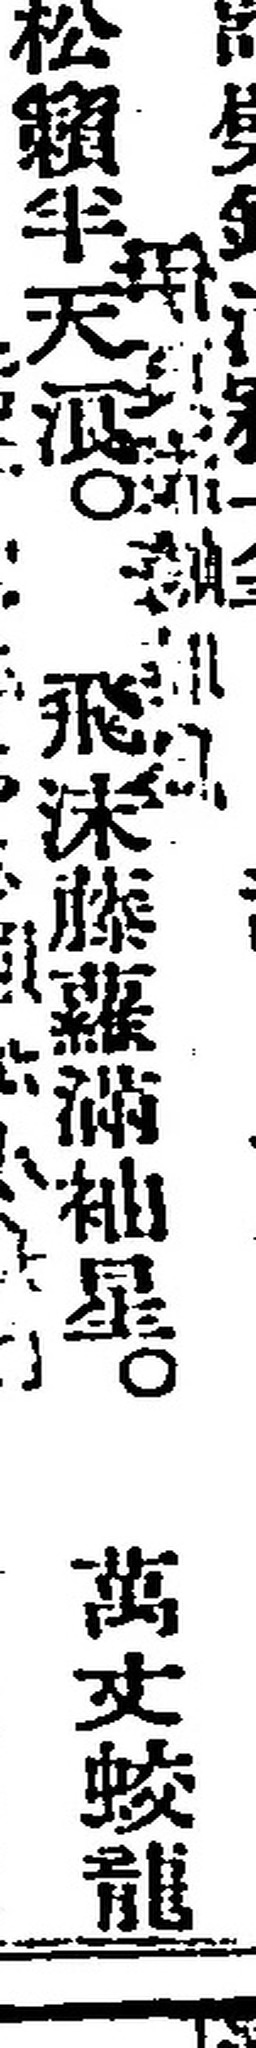松籟半天浪。飛沫藤蘿満袖星。万丈蛟龍
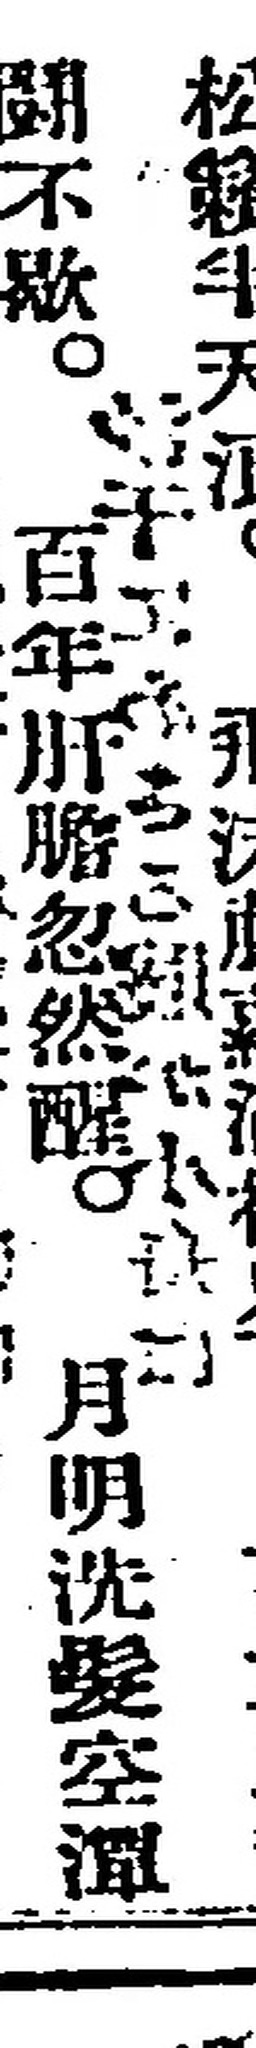闘不歇。百年肝胆忽然醒。月明洗髪空潭
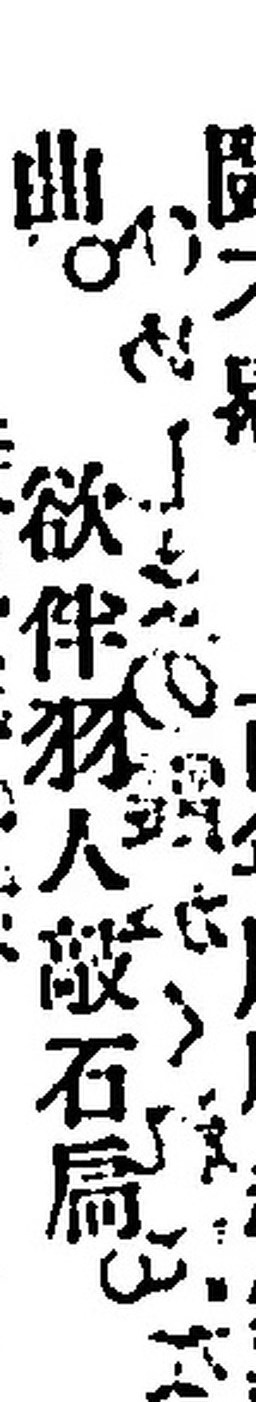曲。欲伴羽人敲石扃。
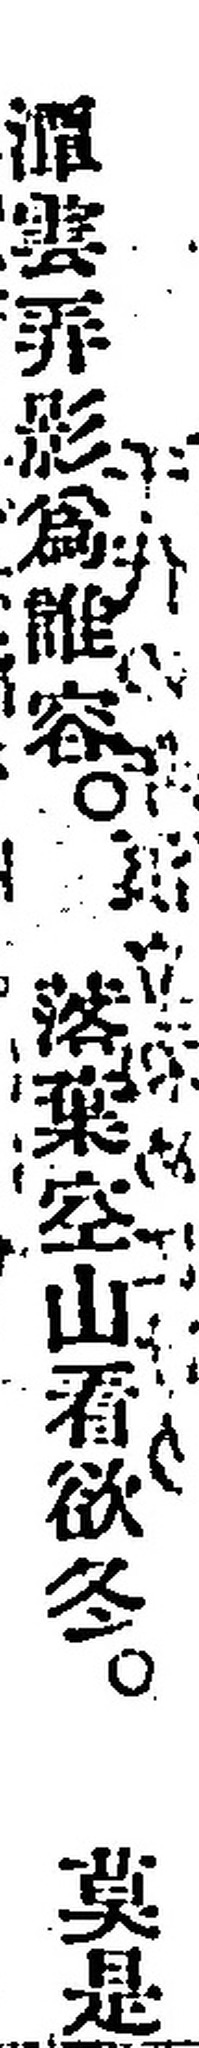潭雲弄影為誰容。落葉空山看欲冬。莫是
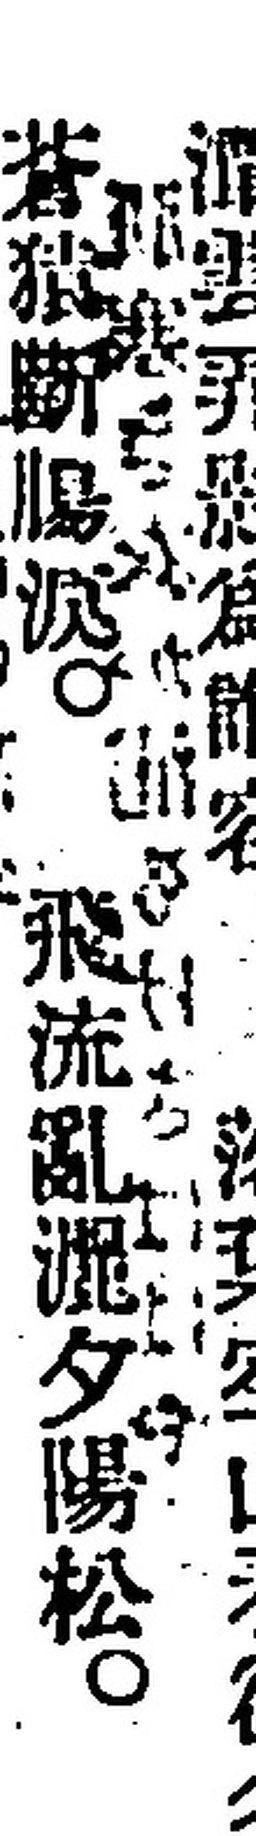蒼猿断腸涙。飛流乱灑夕陽松。
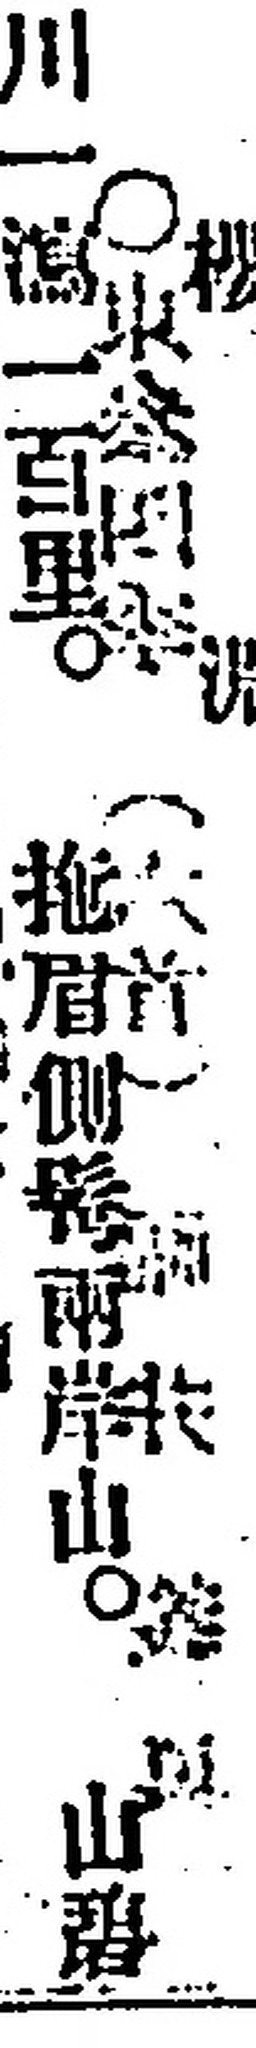豊川一瀉一百里。拖眉側髩両岸山。山碧
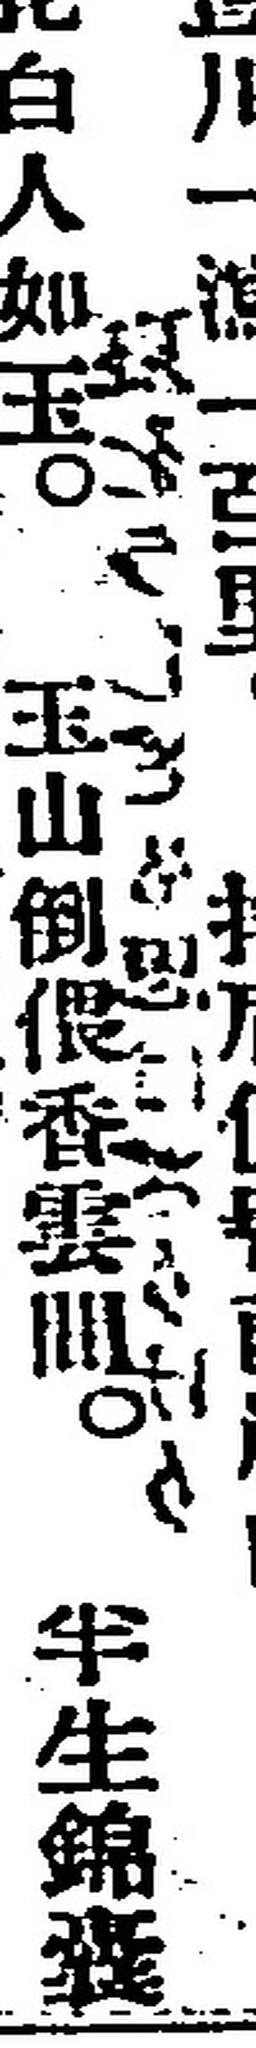花白人如玉。玉山倒偎香雲間。半生錦嚢
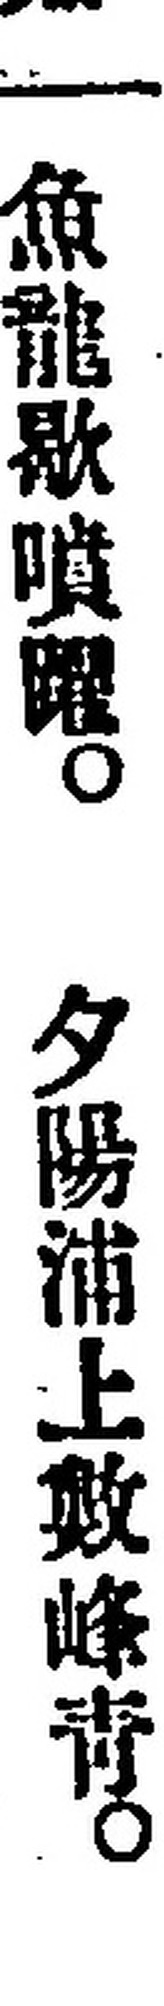魚龍歇噴躍。夕陽浦上数峰青。
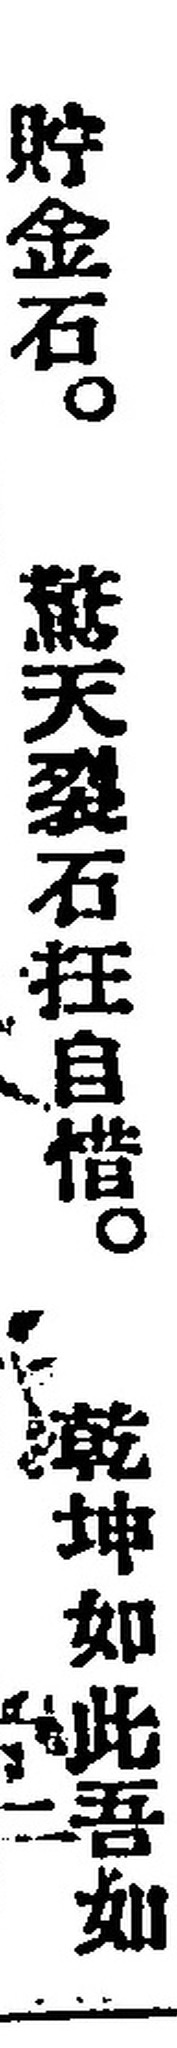貯金石。驚天裂石抂自惜。乾坤如此吾如
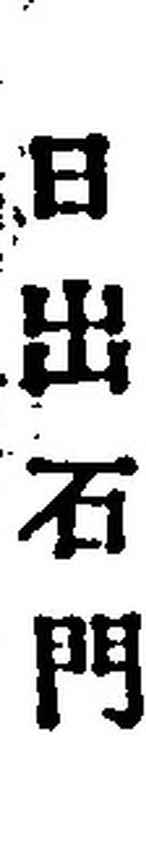日出石門
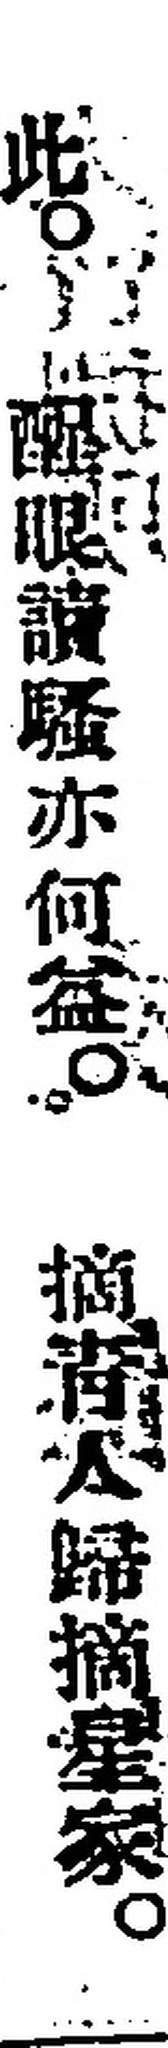此。醒眼読騒亦何益。摘青人帰摘星家。
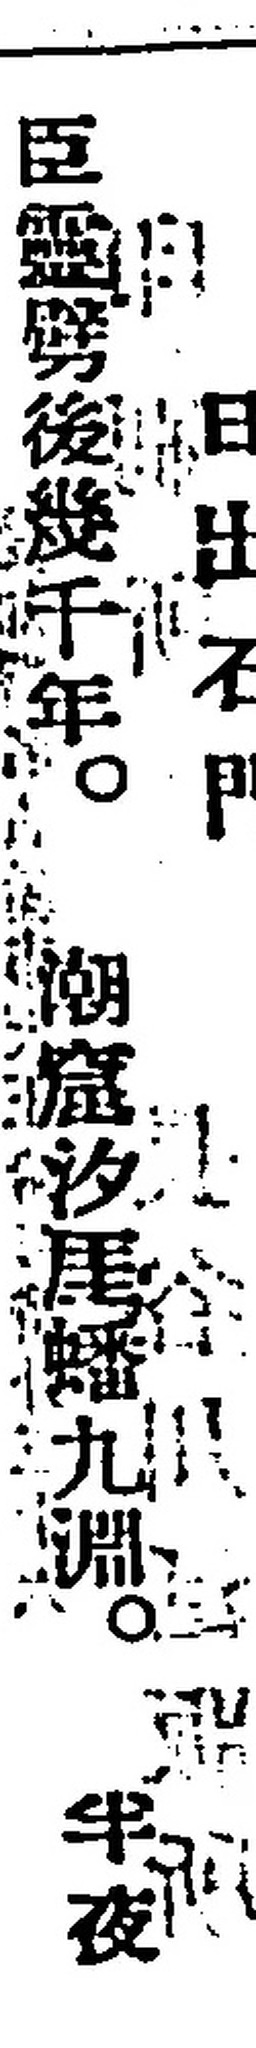臣霊劈後幾千年。潮窟汐厓蟠九淵。半夜
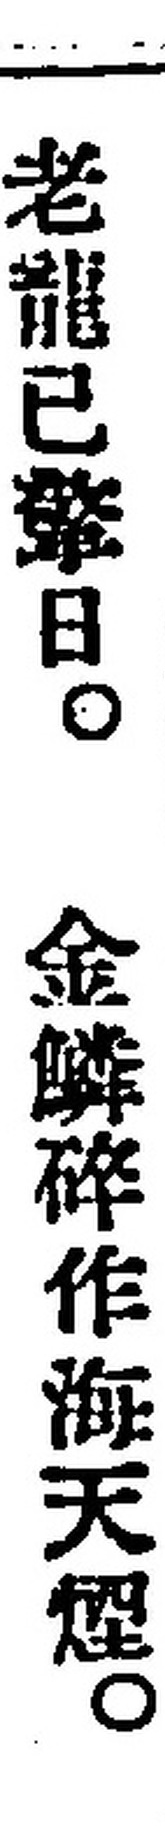老龍已擎日。金鱗砕作海天煙。
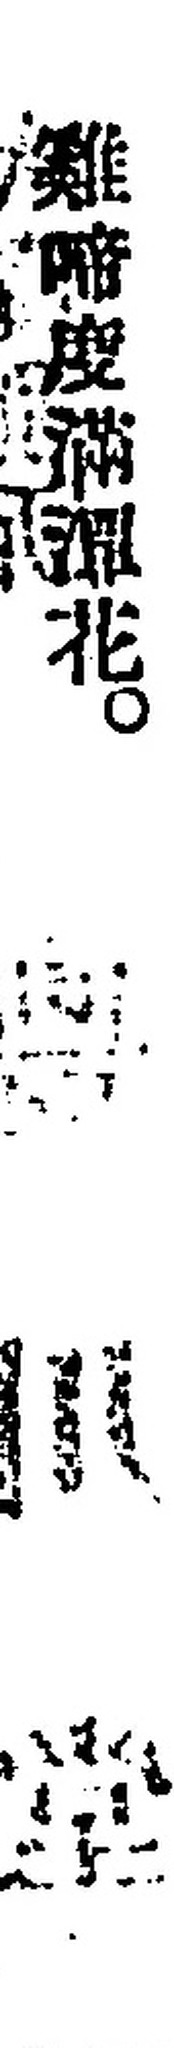雞啼度満潭花。
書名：東参名勝案内
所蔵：国立国会図書館 National Diet Library, JAPAN
